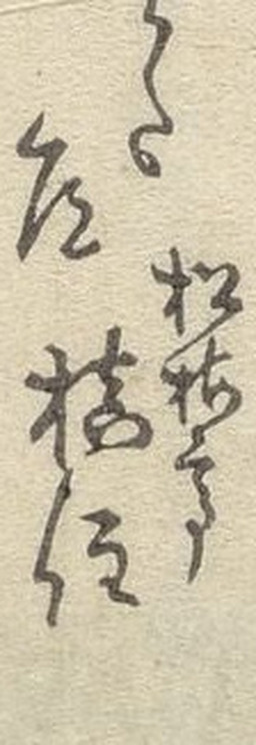道槙住
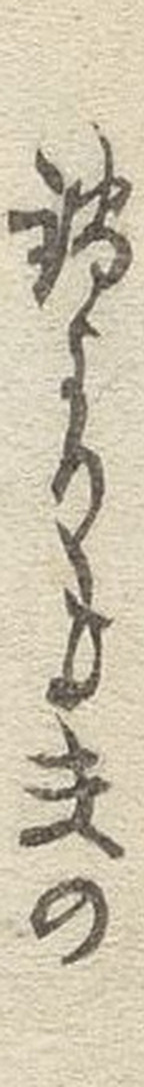鍋よりも夫の
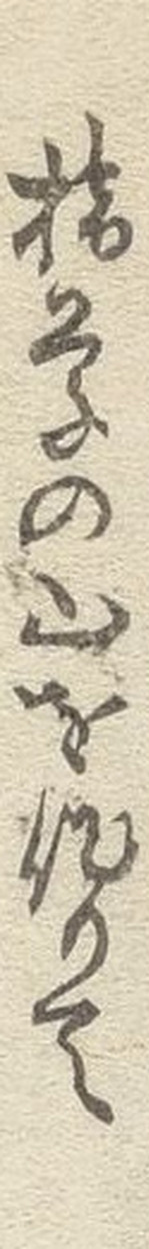枯草の山を作りて
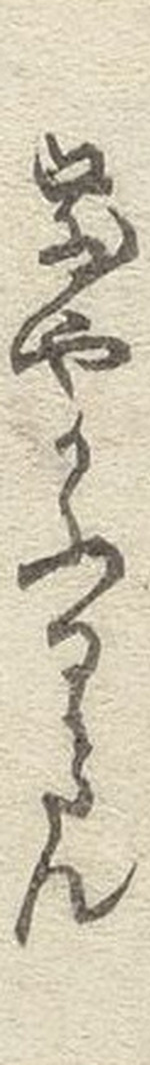散やかふるらん
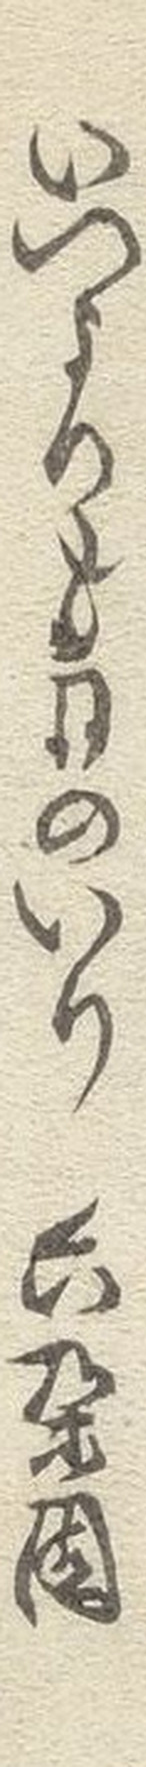いつよりも日のいり六朶園
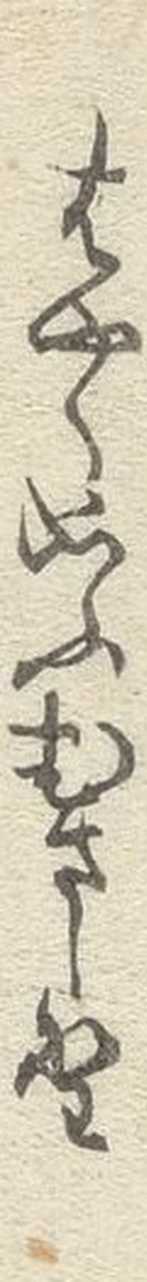はやく思ふむさしの
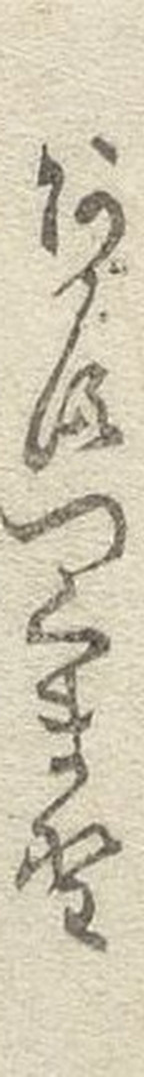あかすつくま野
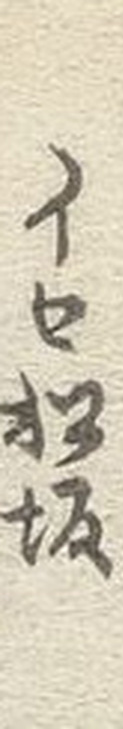イセ松坂
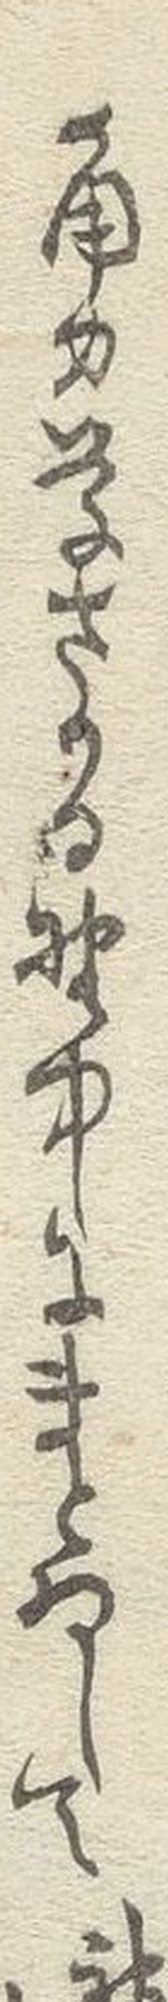角力草さかる野中にまとゐして神風や
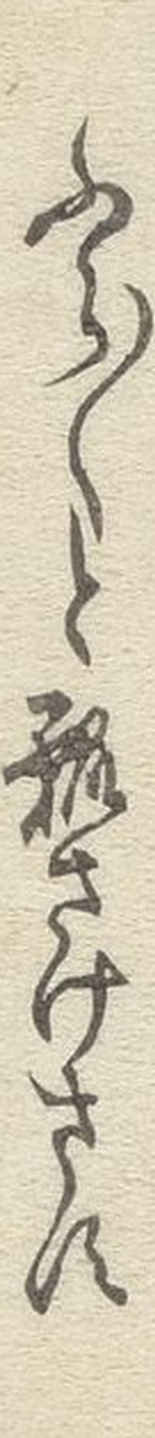ふら〳〵と瓢さけさす
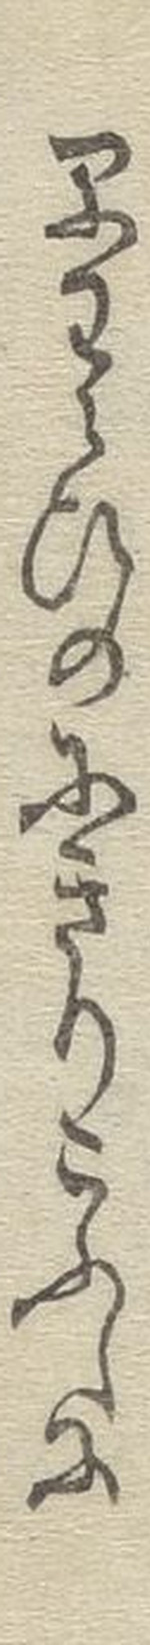早わらひのにきりこふしに

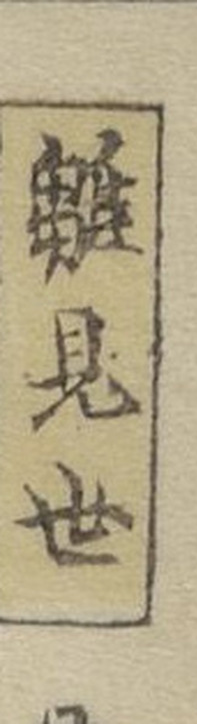雛見世
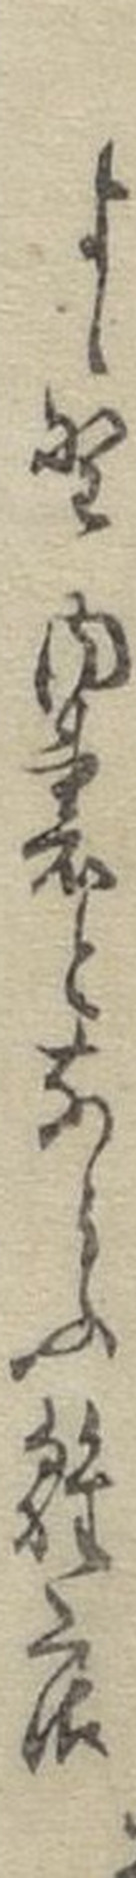吉野内裏とならふ雛店冨芳
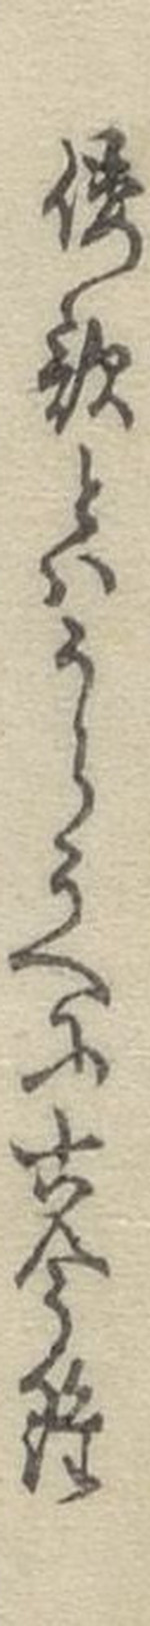倭歌とはうらうへに古今雛清之舎
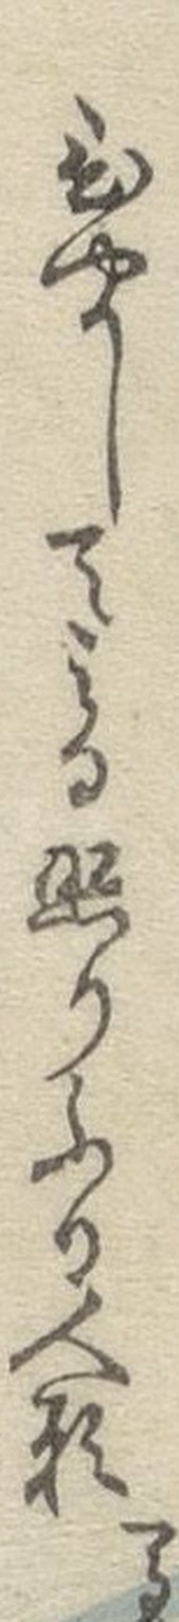ひやかしてみる照りふる人形喜楽
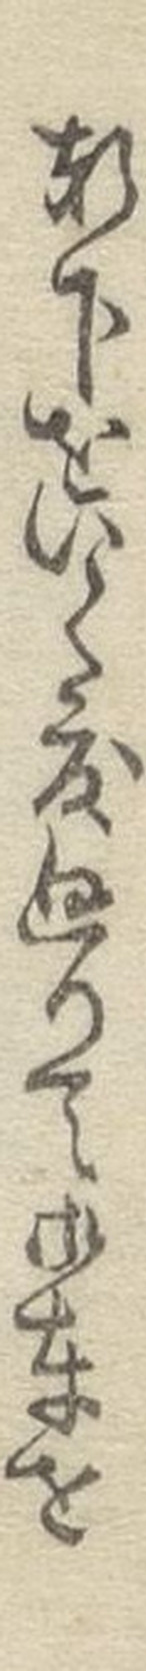軒下をいく度廻りて御車を
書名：Picture Album of People with Kyōka (Light Verse) (Kyōka shiki jinbutsu 狂歌四季人物)
